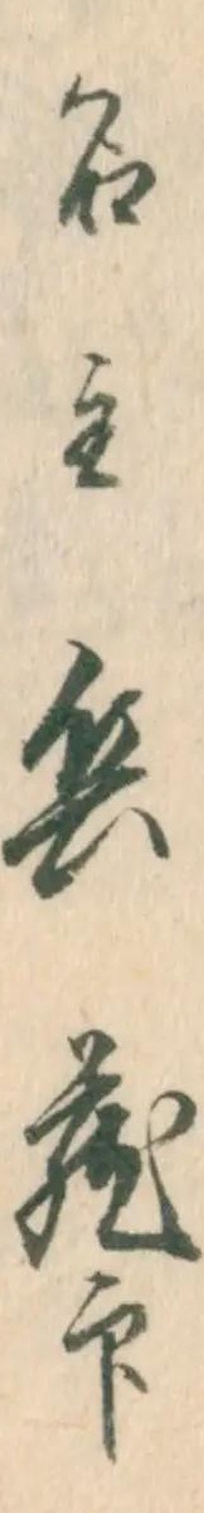名主兵蔵印

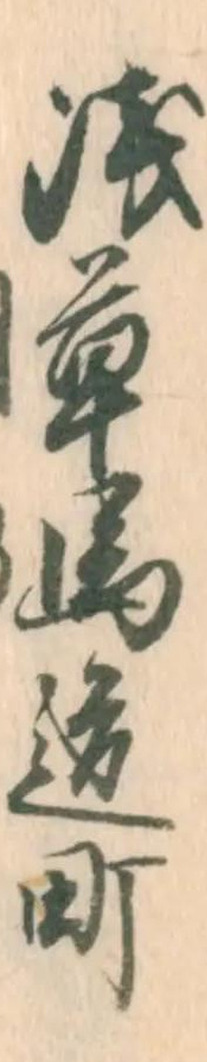浅草馬道町
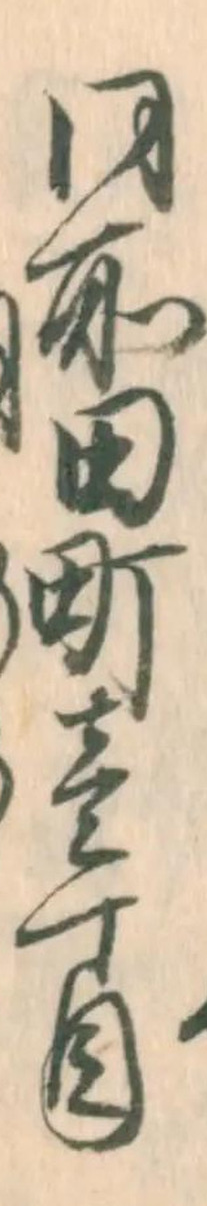同所田町壱丁目
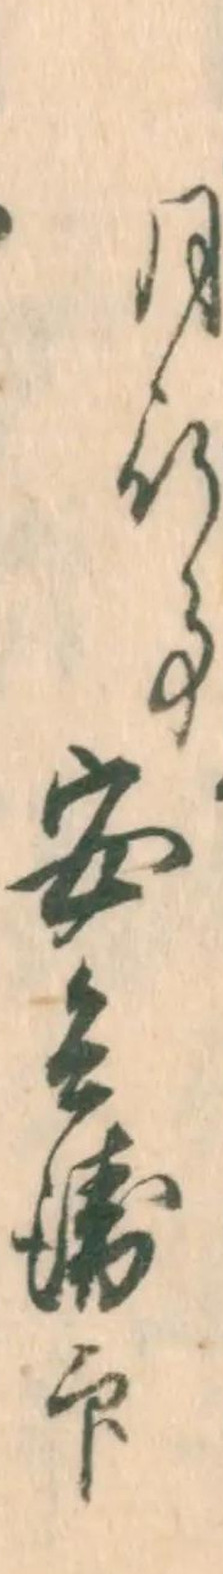月行事安兵衛印
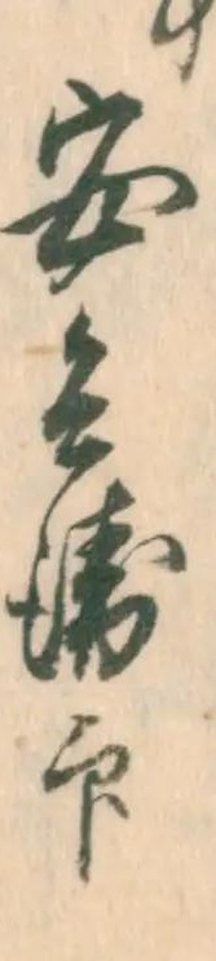月行事安兵衛印
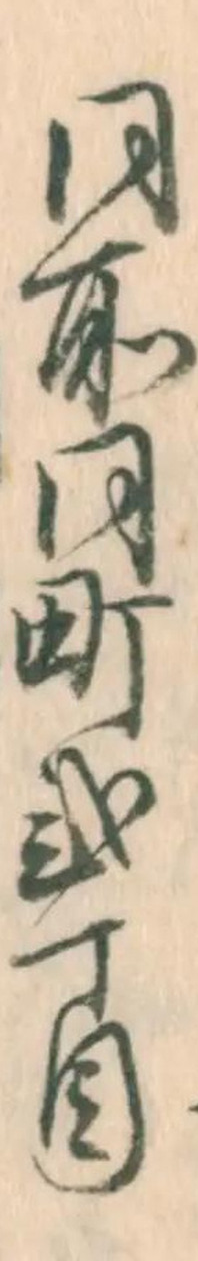同所同町弐丁目
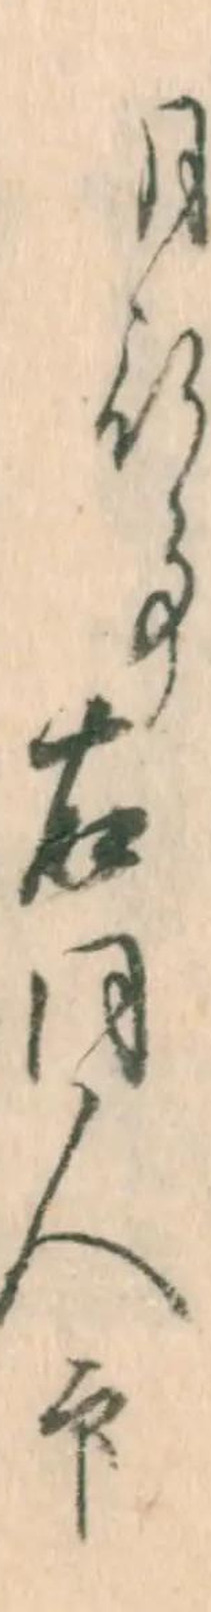月行事右同人印
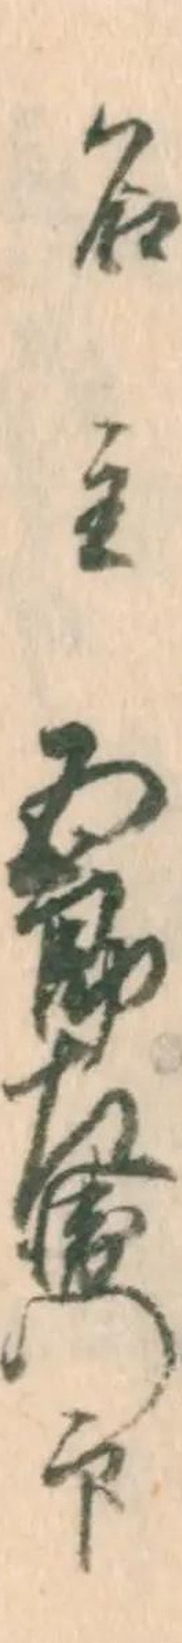名主五郎左衛門印
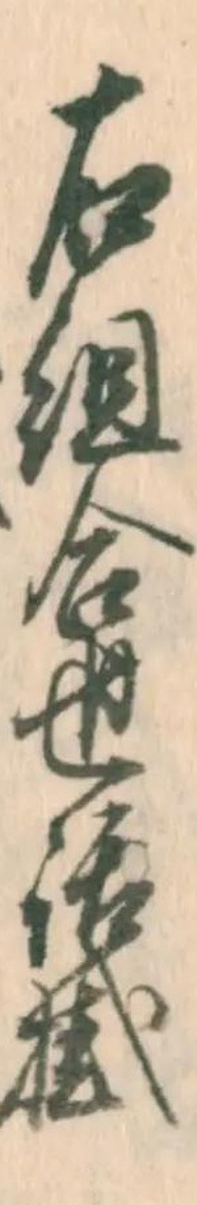右組合世話掛
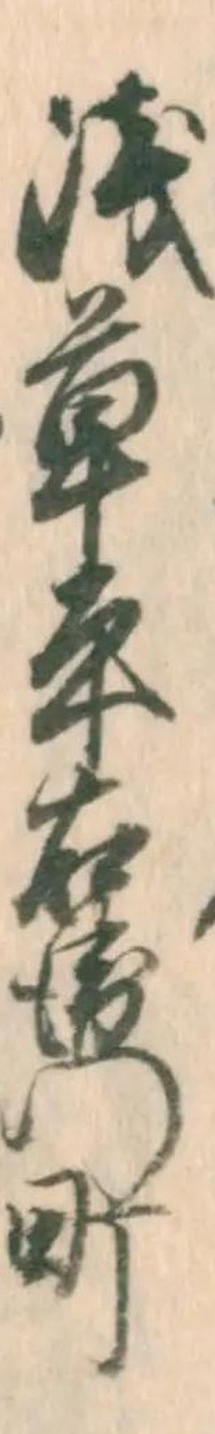浅草平右衛門町
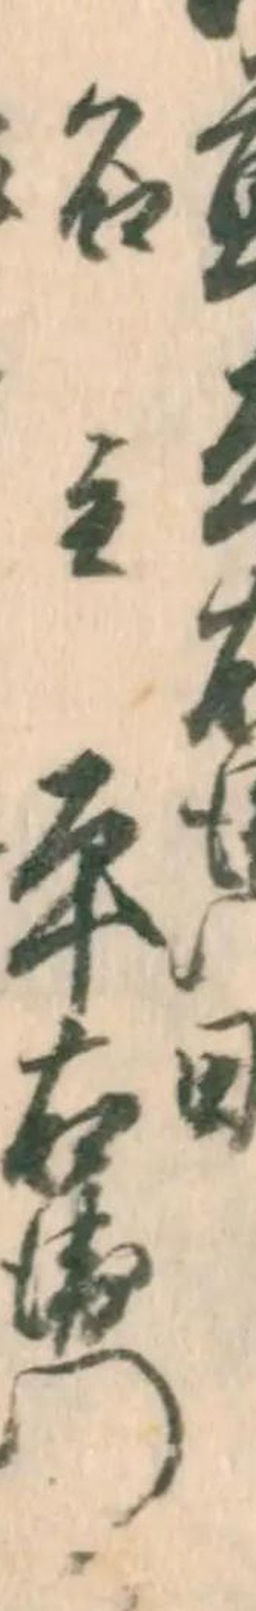名主平右衛門
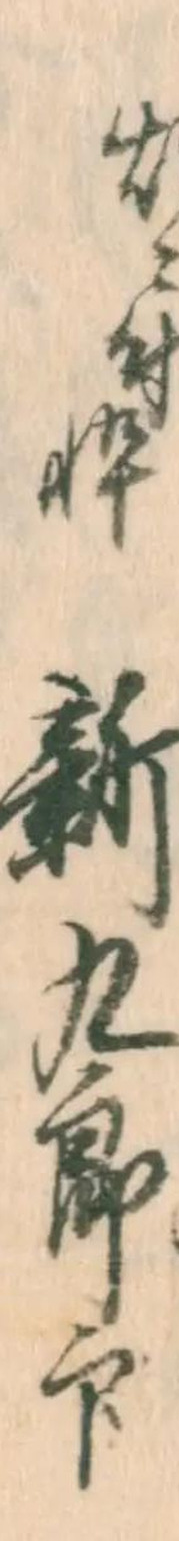煩ニ付倅新九郎印
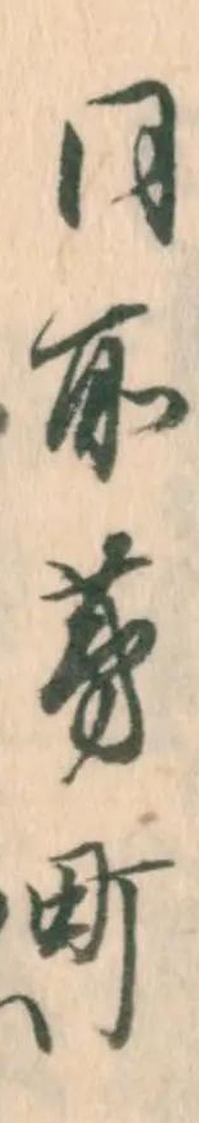同所茅町
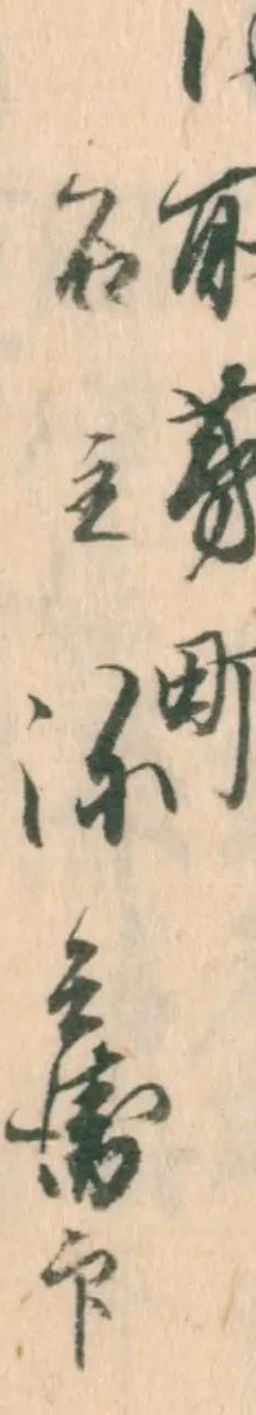名主弥兵衛印
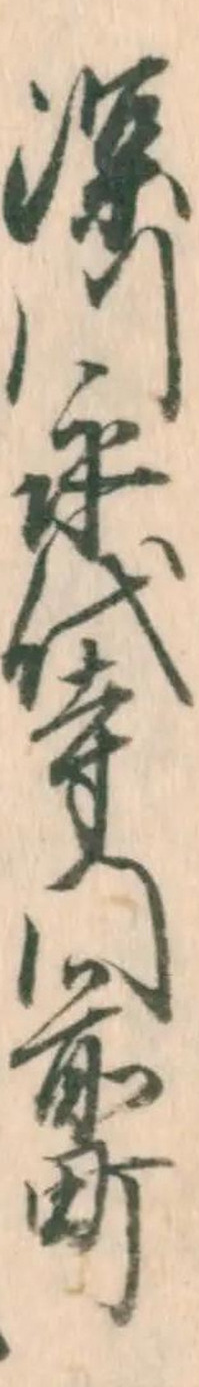深川永代寺門前町
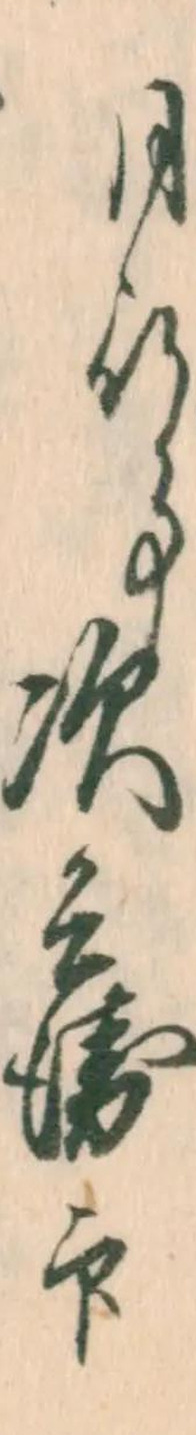月行事次兵衛印
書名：地震災書留 2巻. [2] 内表紙に「地震一件　安政二卯年十月」とあり
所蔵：国立国会図書館 National Diet Library, JAPAN
